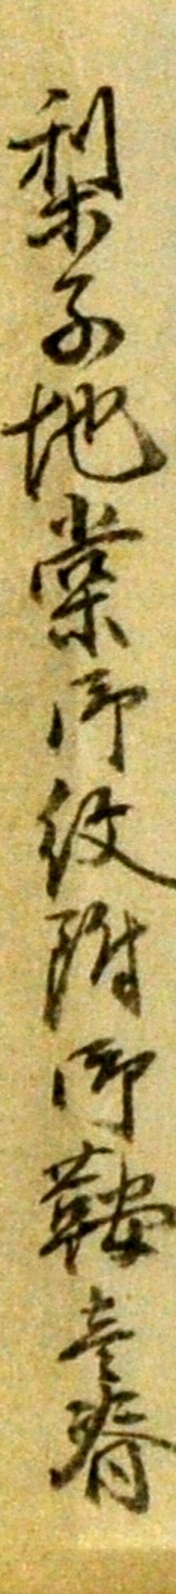梨子地棠御紋附御鞍壱脊

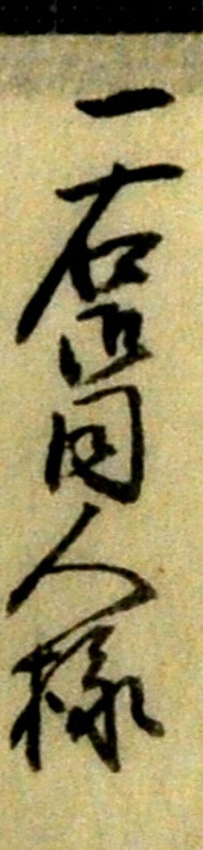一右御同人様
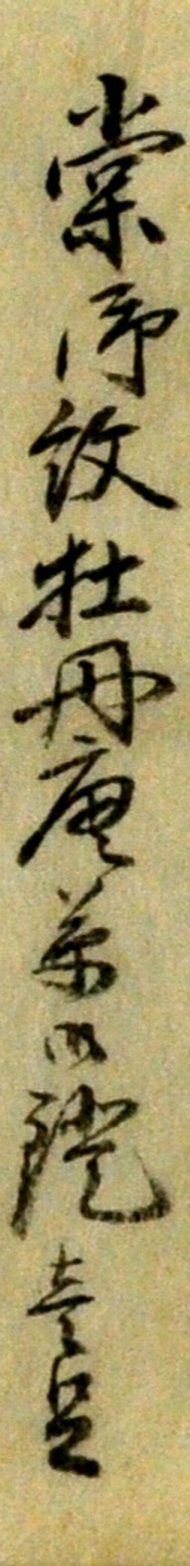棠御紋牡丹唐草御鐙壱足
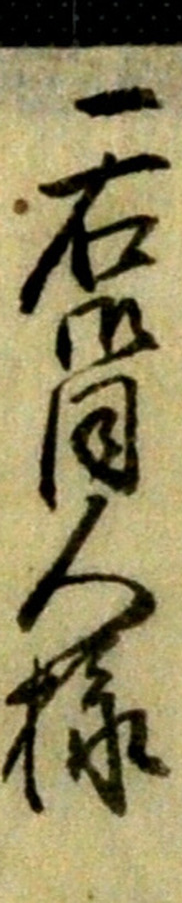一右御同人様
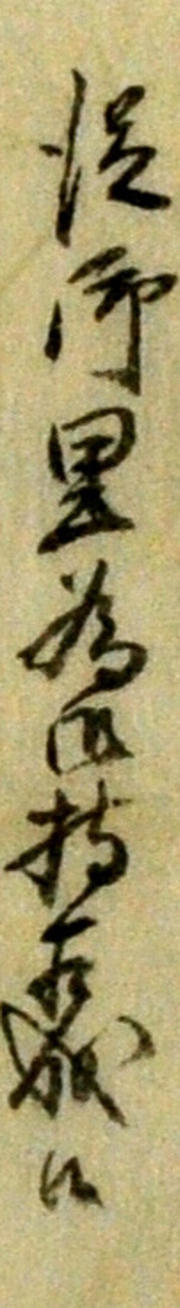従御里為御持相成候
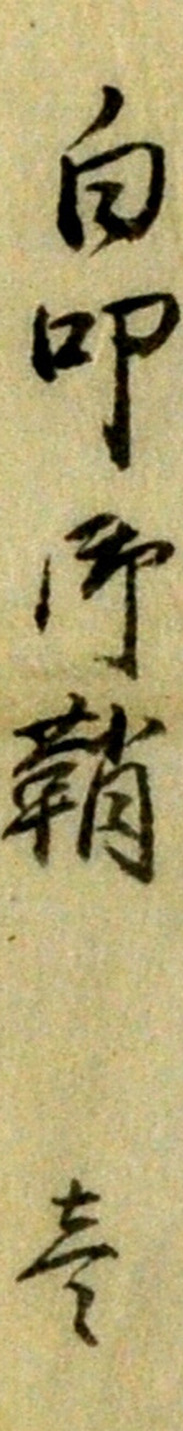白叩御鞘壱
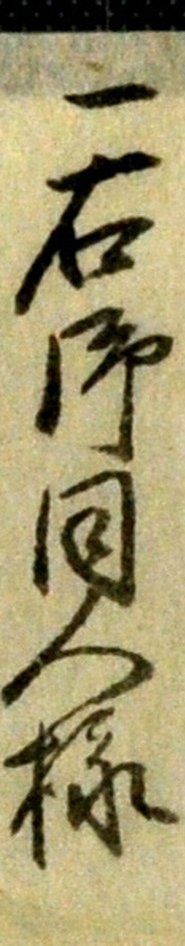一右御同人様
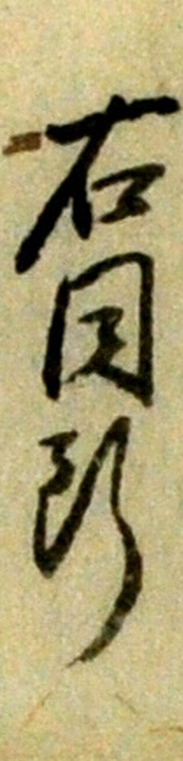右同断
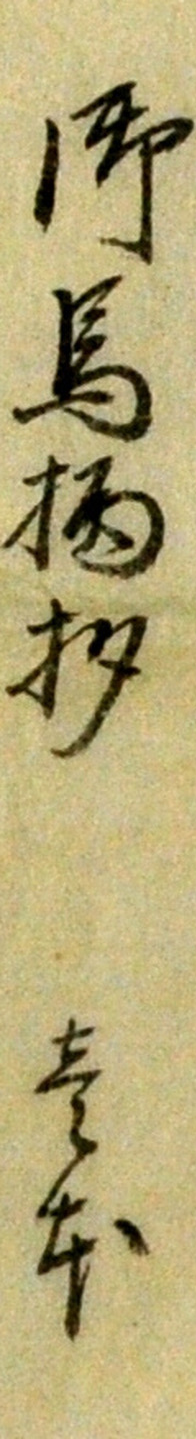御馬柄杓壱本
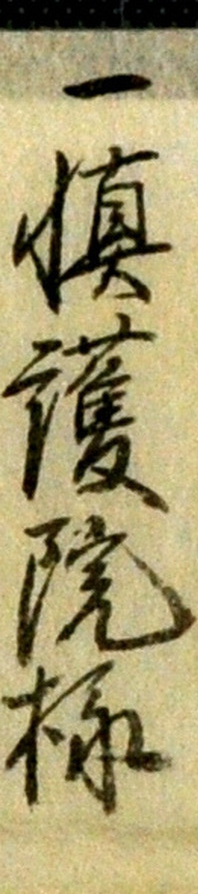一慎護院様
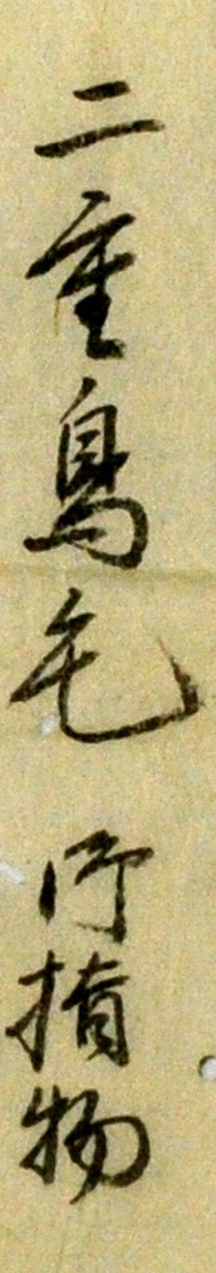二重鳥毛御指物
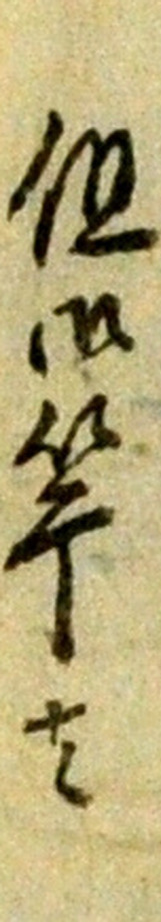但御竿者
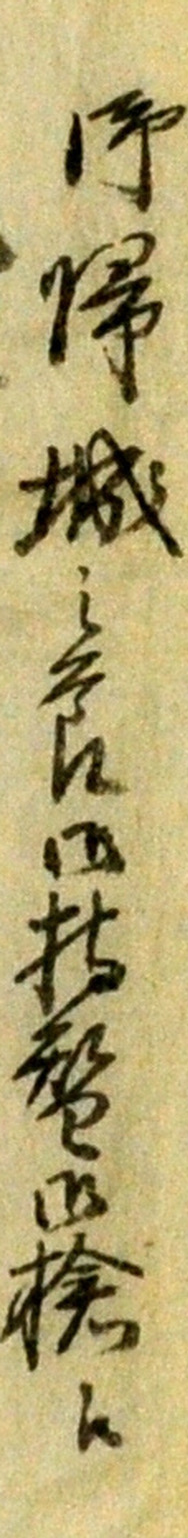御帰城之節御持替御槍江
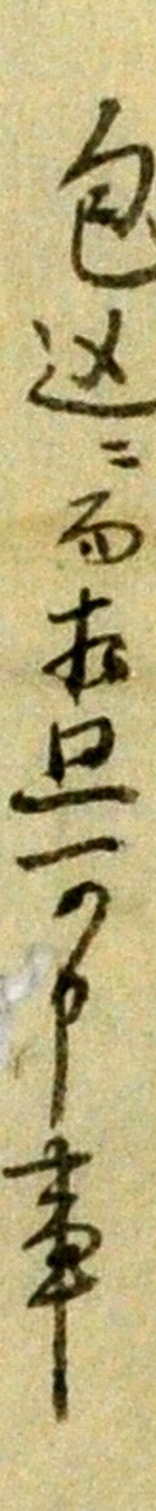包込而相廻可申事
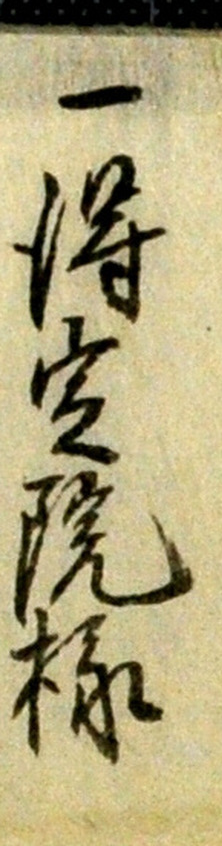一得定院様
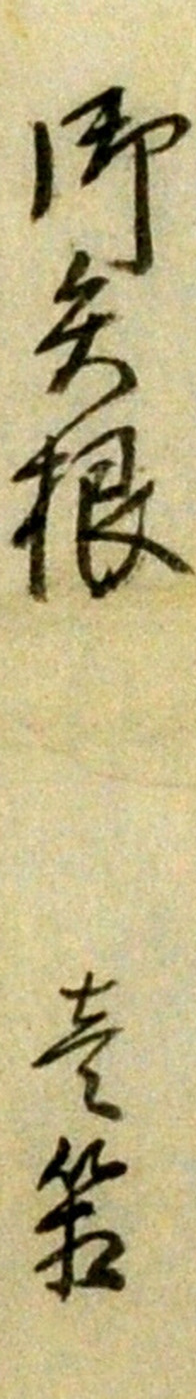御矢根壱箱
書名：目録
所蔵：伊那市立高遠町図書館・合同会社AMANE
